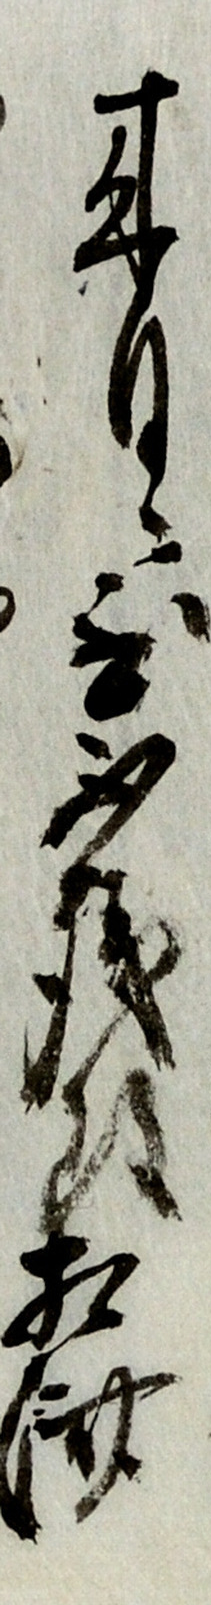来月ニ至不残改相済
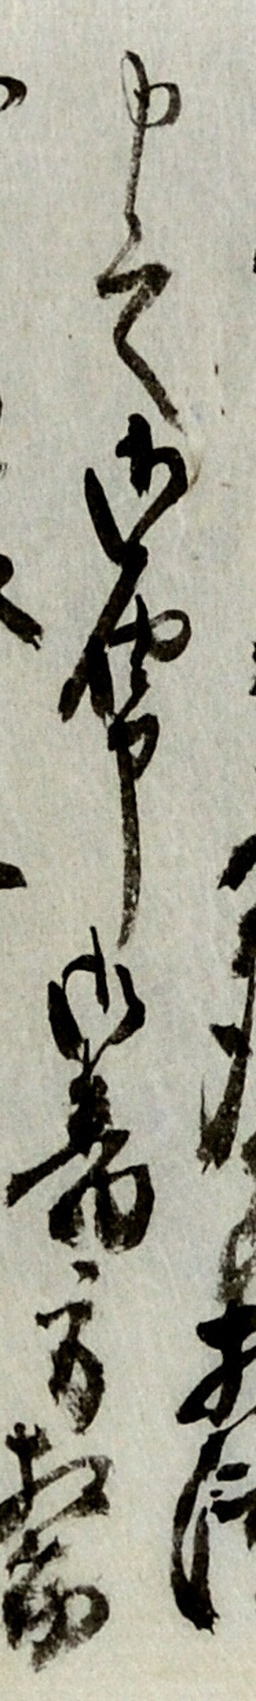申上候御届申御番方相勤
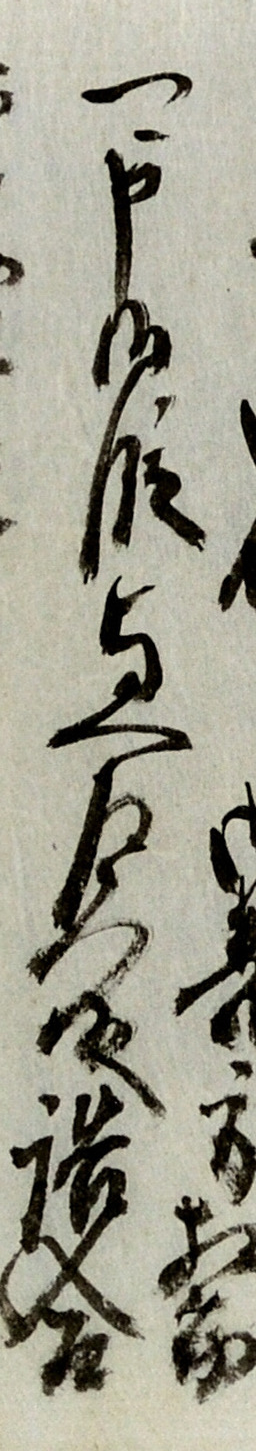可申候段与左衛門殿詰合
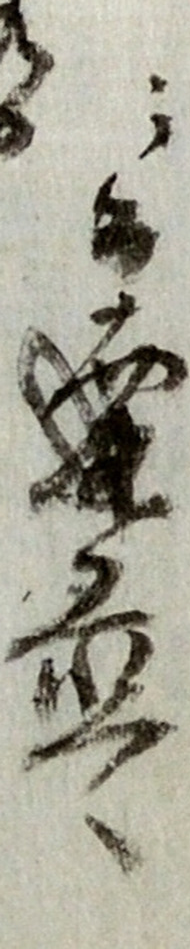ニ而達置候
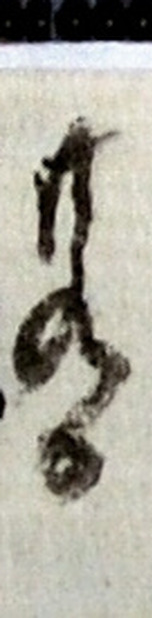廿九日
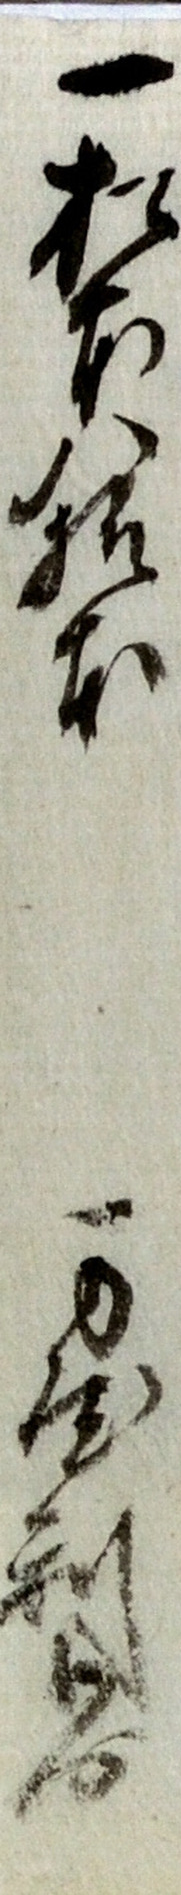一松木八拾本万屋利左衛門
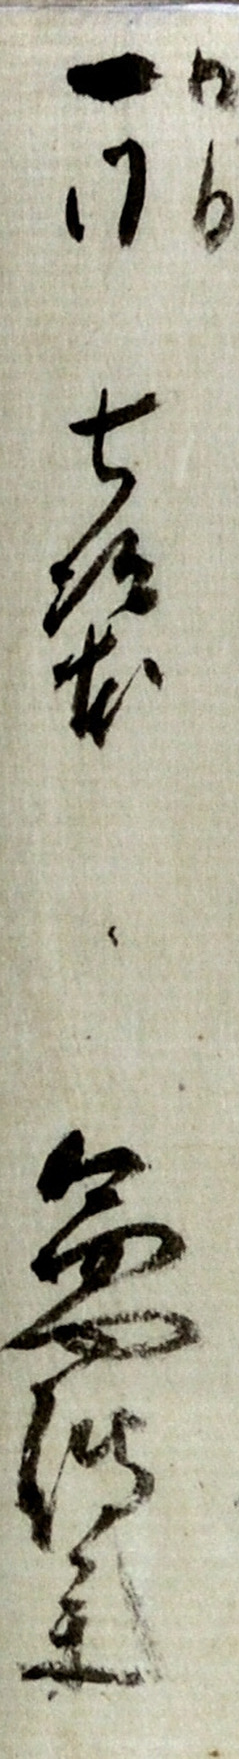一同七拾本富や伝兵衛

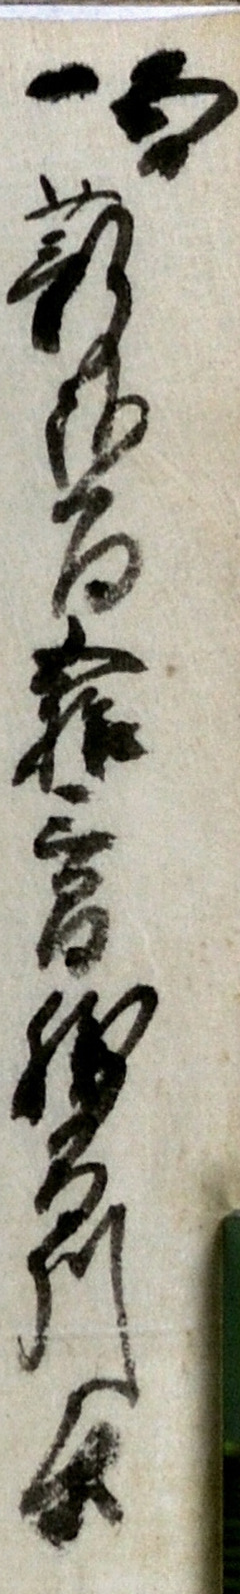一薪弐百五拾三間勝間川原
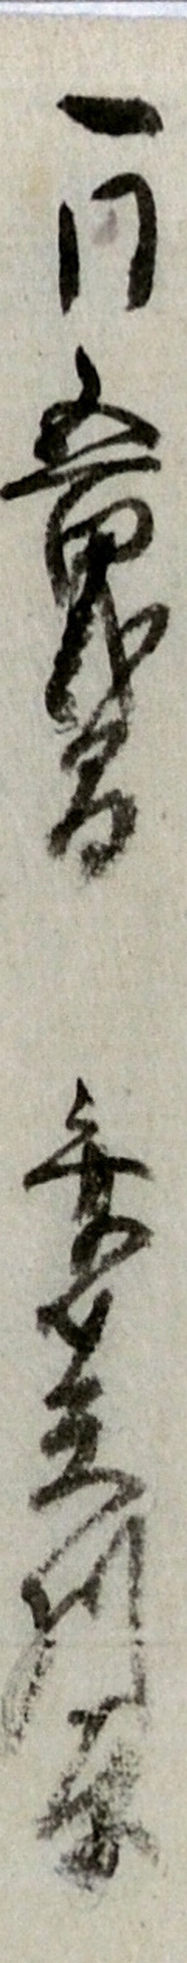一同五百弐間弁才天川原
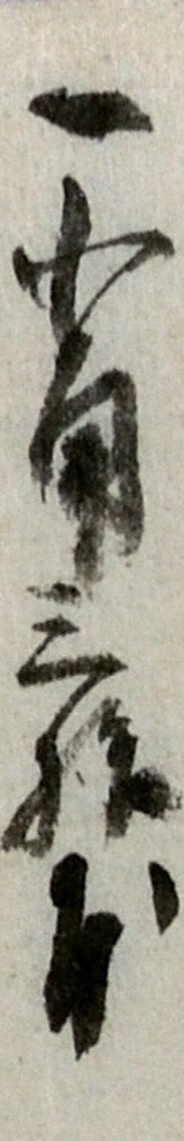一小角三拾本
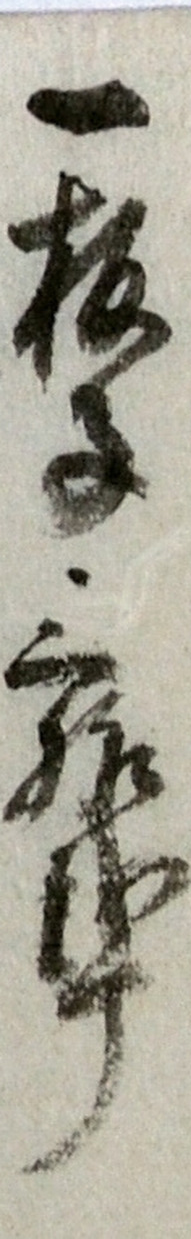一板子三拾弐丁
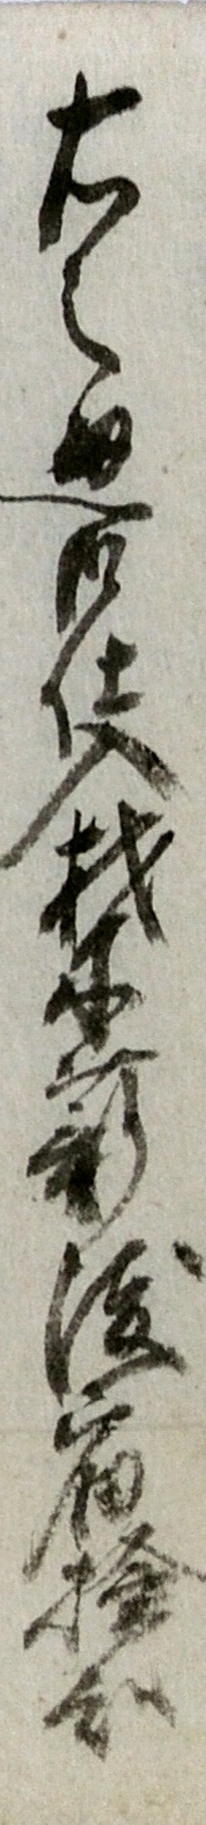右之通御仕入材木薪渡着検知
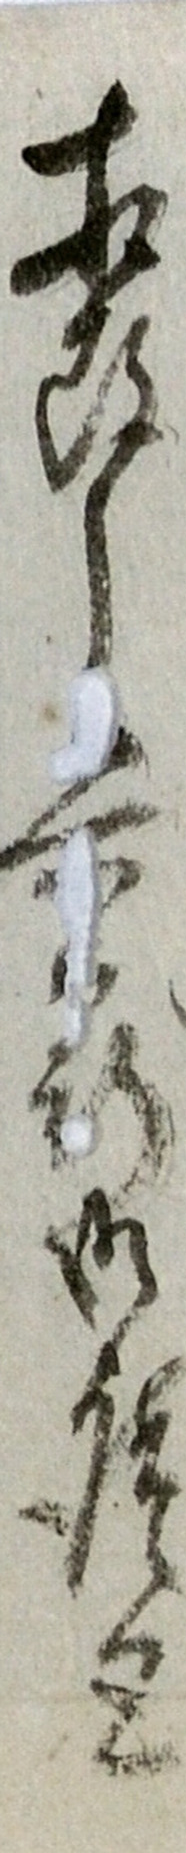相改申候所如斯御座候以上
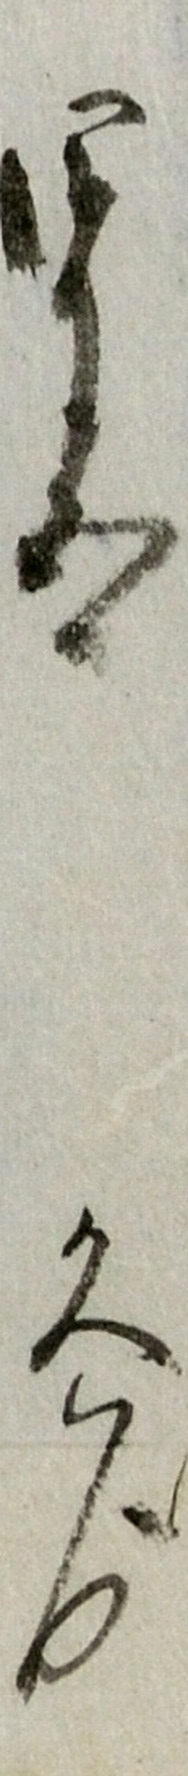四月五日久左衛門
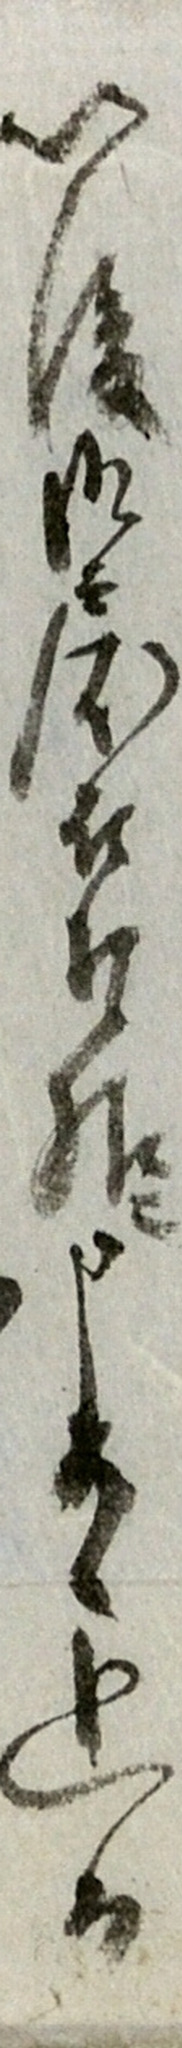以後御戻被下候様ニ申上候追而
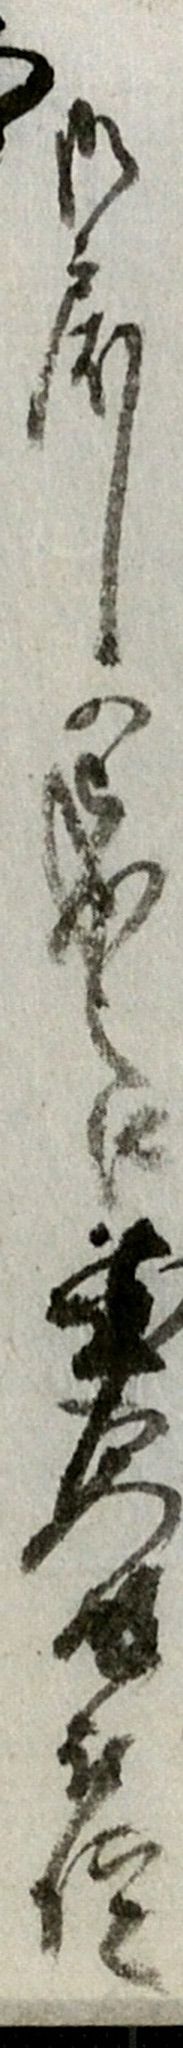御戻し可被成之由団右衛門殿被仰候
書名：分一方諸事御用留帳
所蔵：伊那市立高遠町図書館・合同会社AMANE
